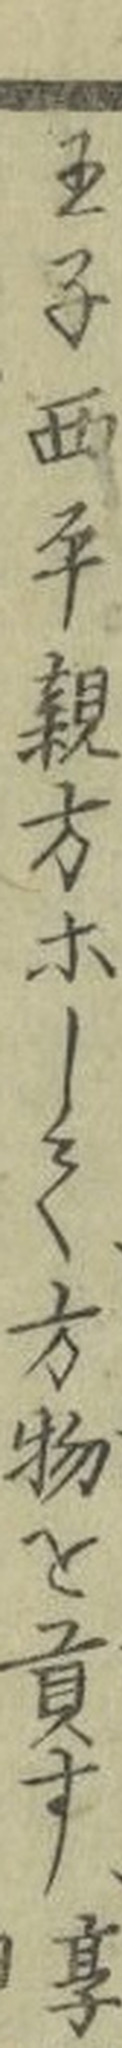山王子小録親方等をして、方物を貢す、
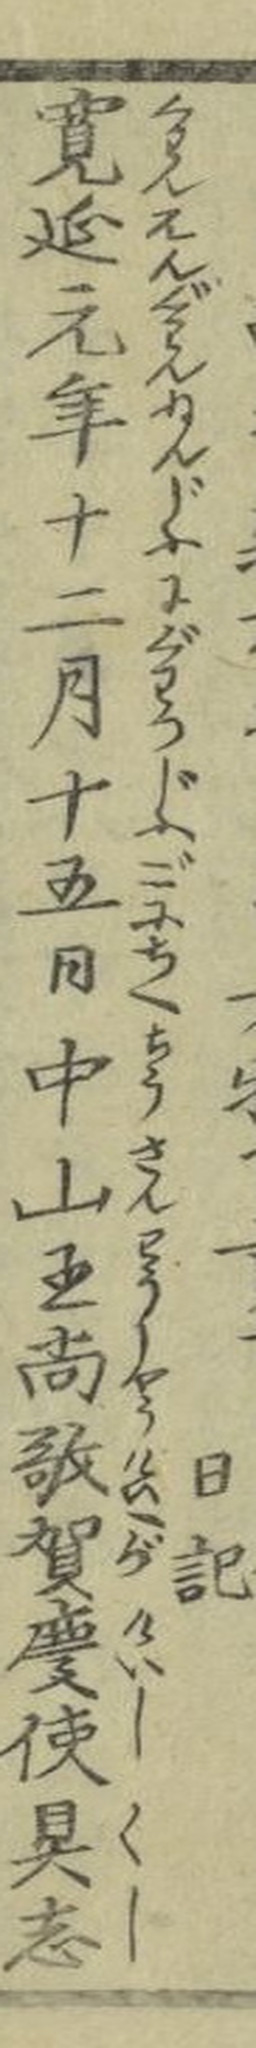寛延元年十二月十五日、中山王尚敬、賀慶使具志
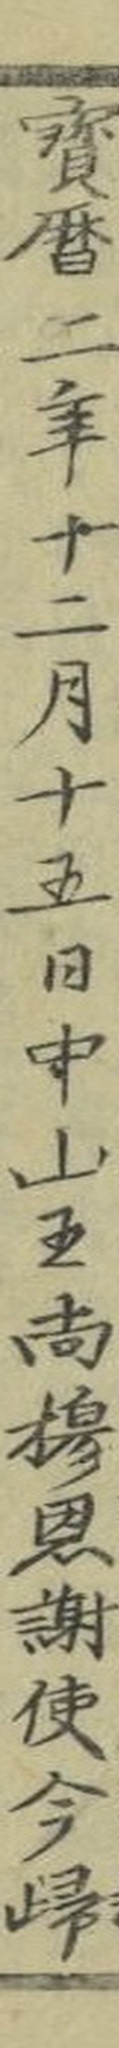宝暦二年十二月十五日、中山王尚穆、恩謝使今帰
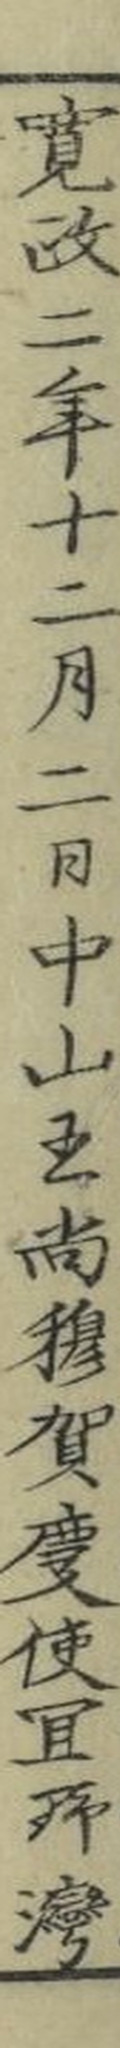寛政二年十二月二日、中山王尚穆、賀慶使宜野湾
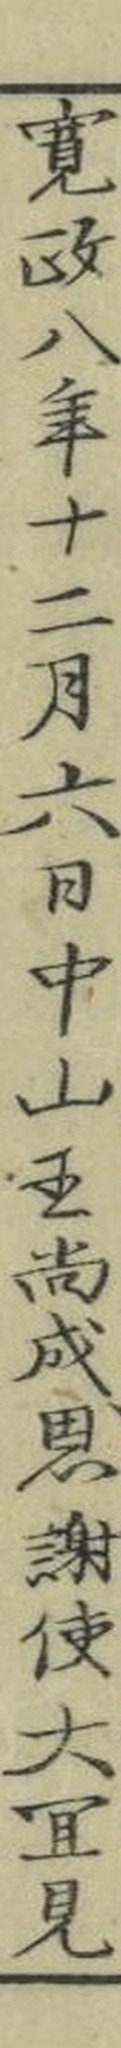寛政八年十二月六日、中山王尚成、恩謝使大宜見
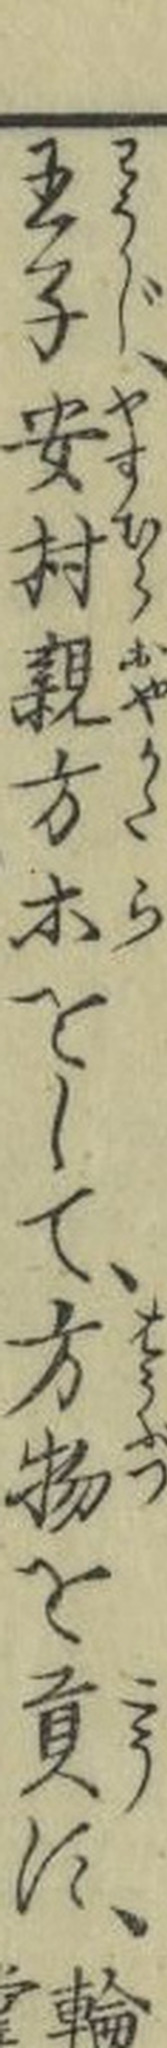山王子小録親方等をして、方物を貢す、
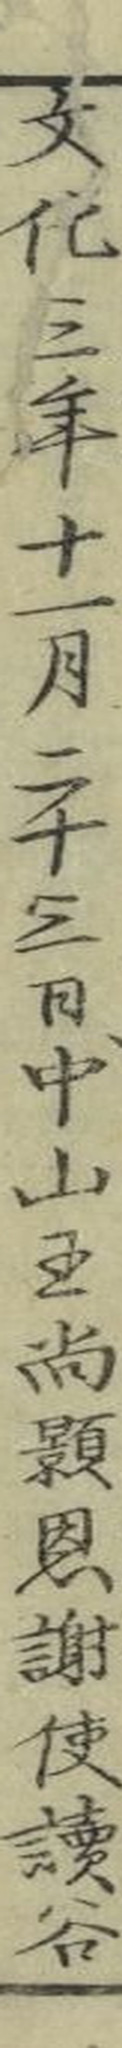文化三年十一月二十三日、中山王尚顥、恩謝使読谷
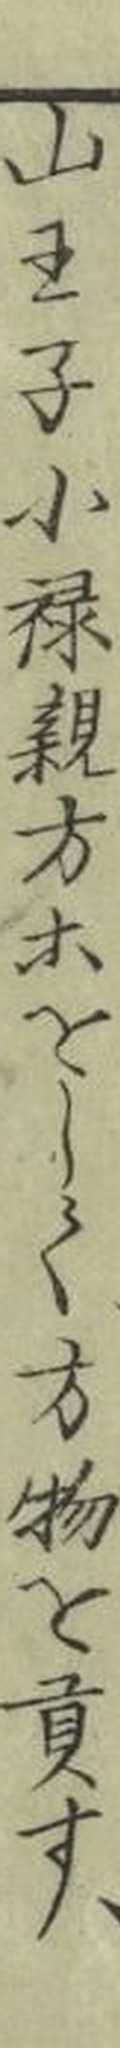山王子小録親方等をして、方物を貢す、
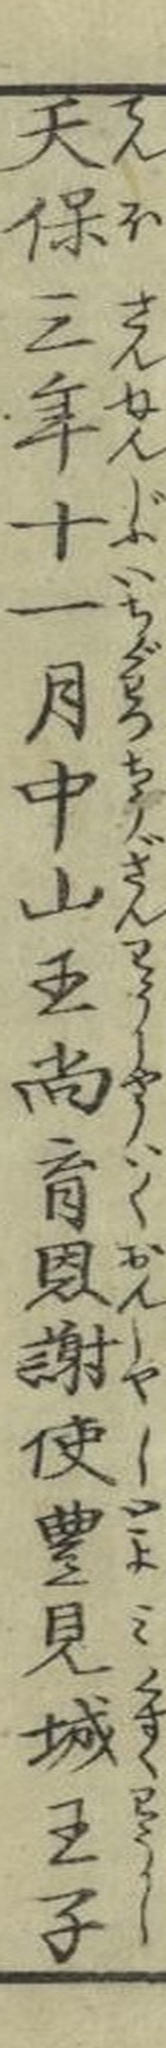天保三年十一月中山王尚育恩謝使豊見城王子
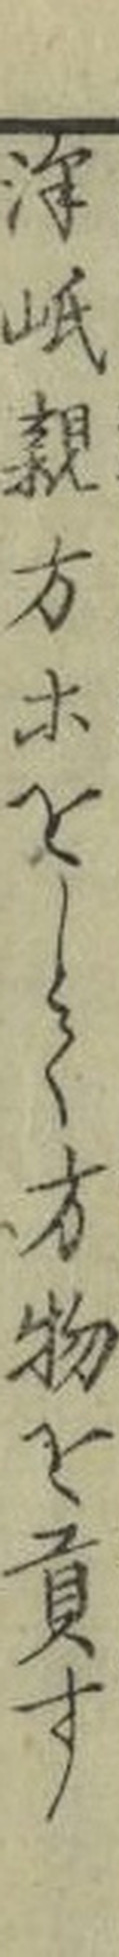沢岻親方等をして方物を貢す

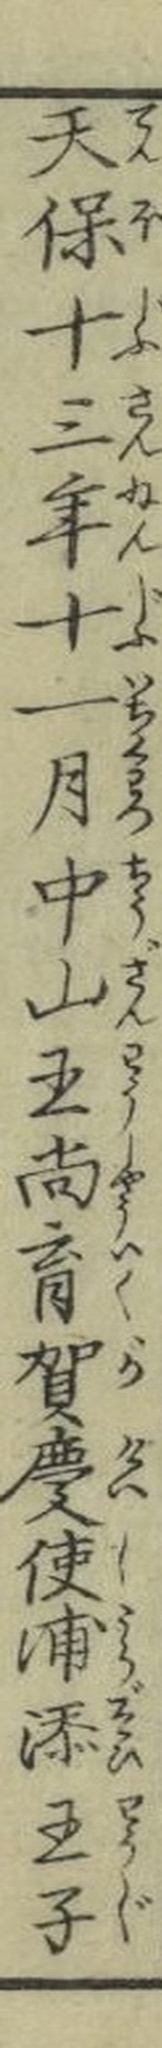天保十三年十一月中山王尚育賀慶使浦添王子
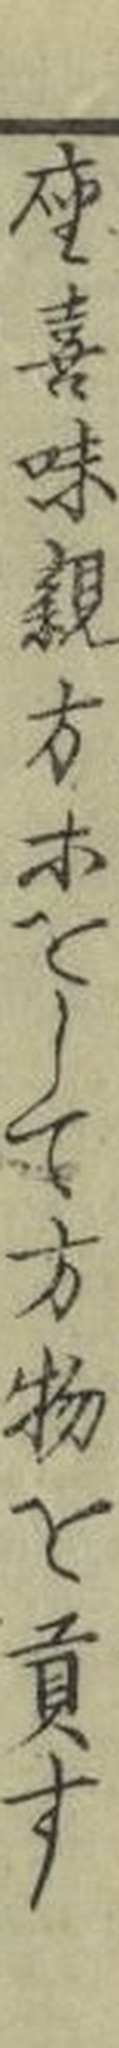座喜味親方等をして方物を貢す
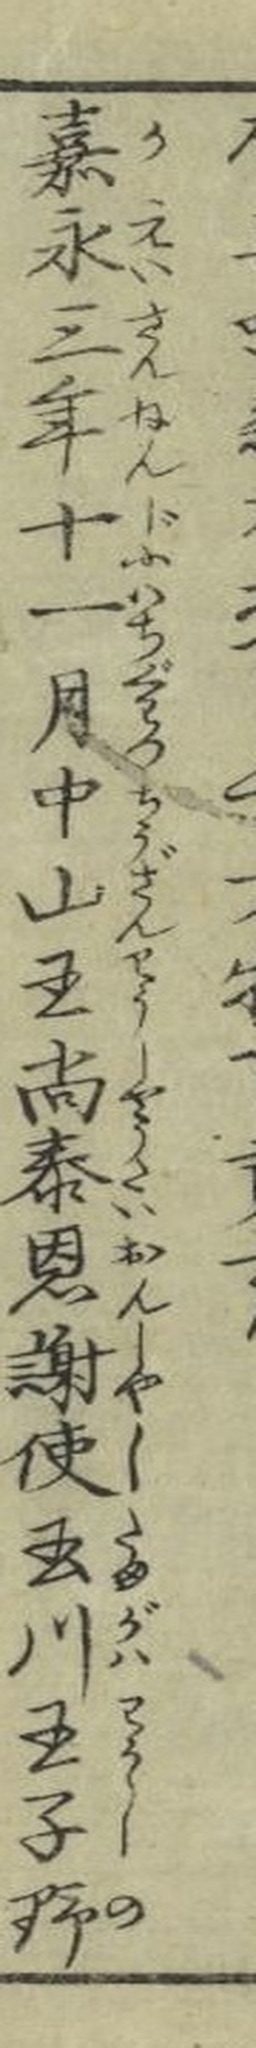嘉永三年十一月中山王尚泰恩謝使玉川王子野
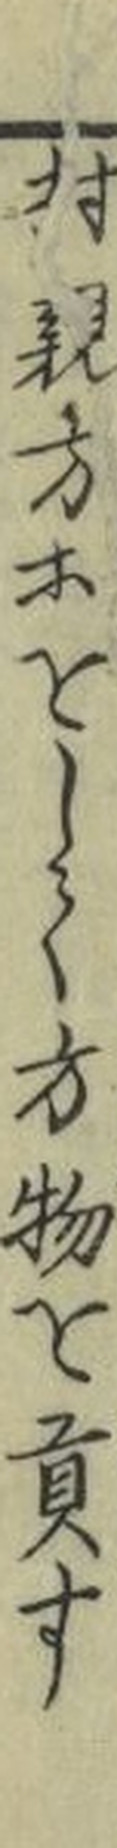村親方等をして方物を貢す
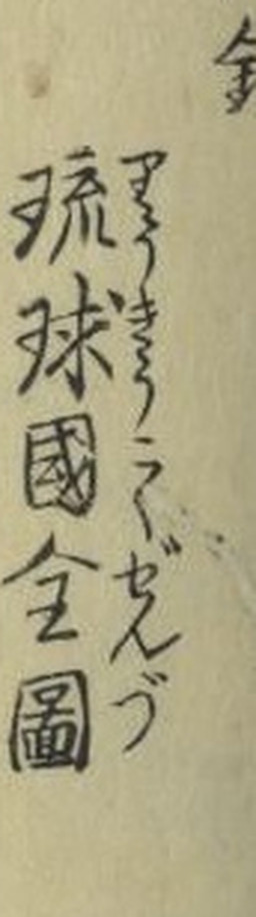琉球国全図
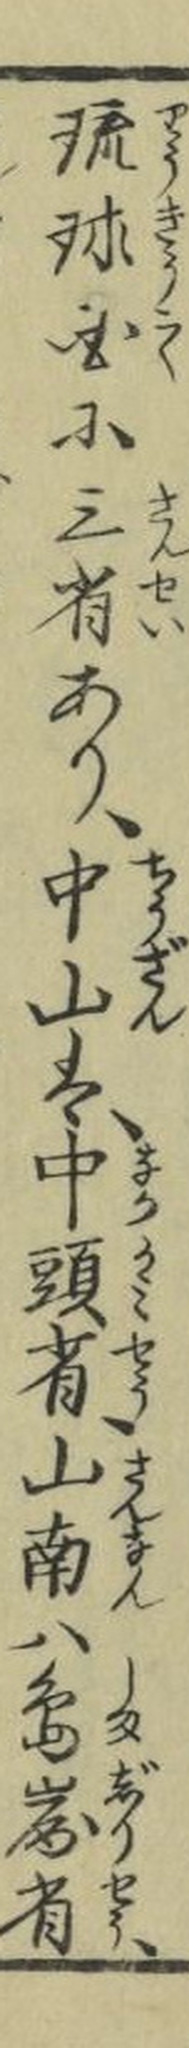琉球国に三省あり、中山は、中頭省、山南は島省、
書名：琉球入貢紀略
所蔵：University of the Ryukyus Library
